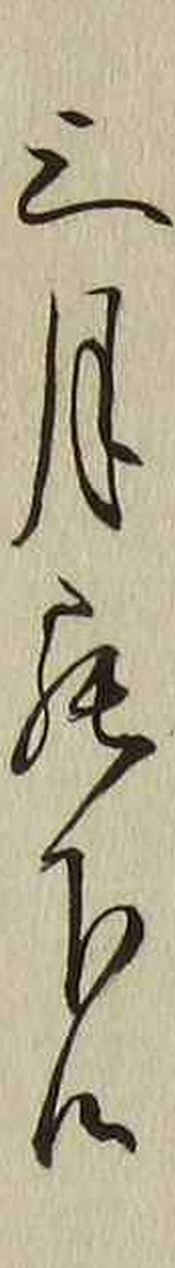三月罷下候
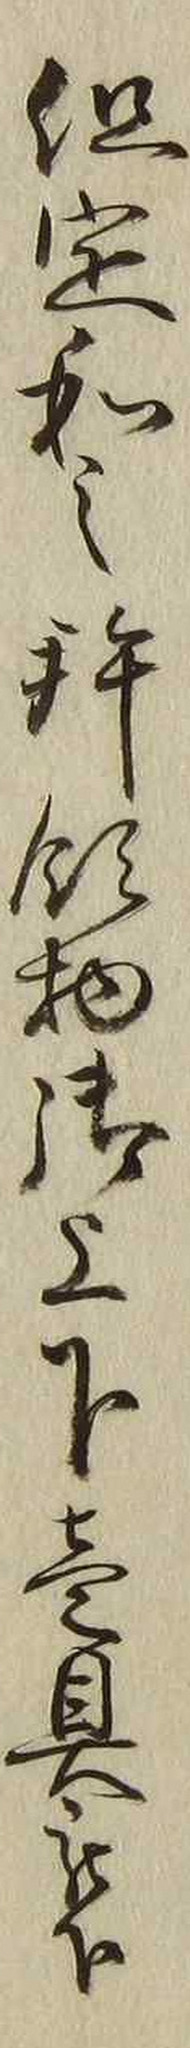但定和之拝領物御上下壱具被下
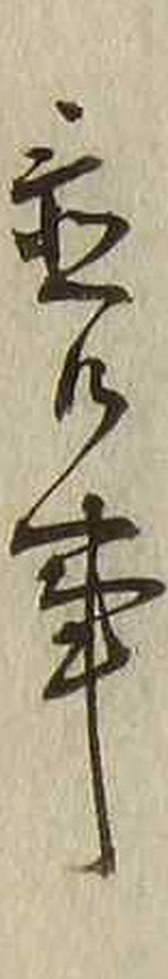置候事
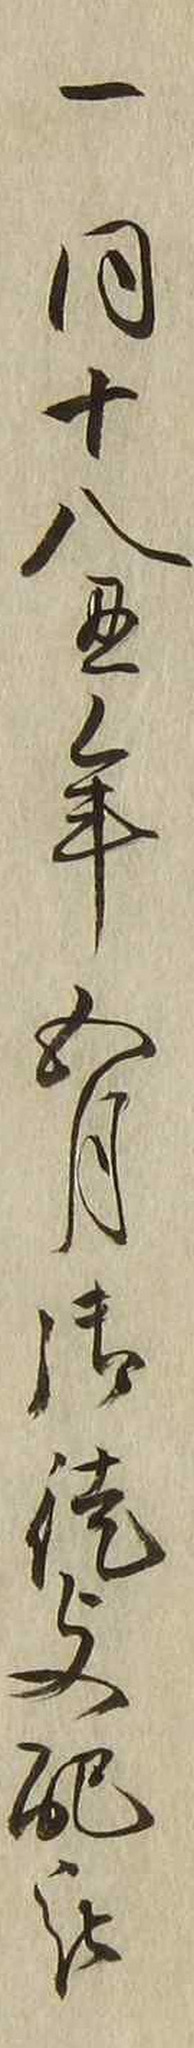一同十八丑年五月御徒支配被
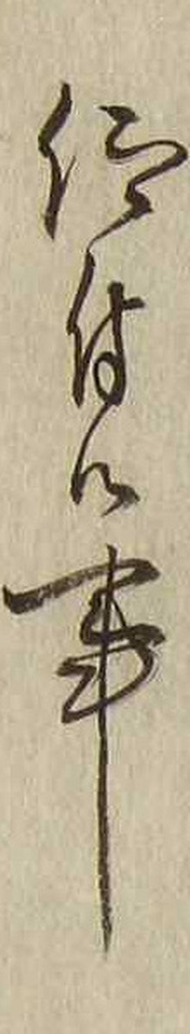仰付候事

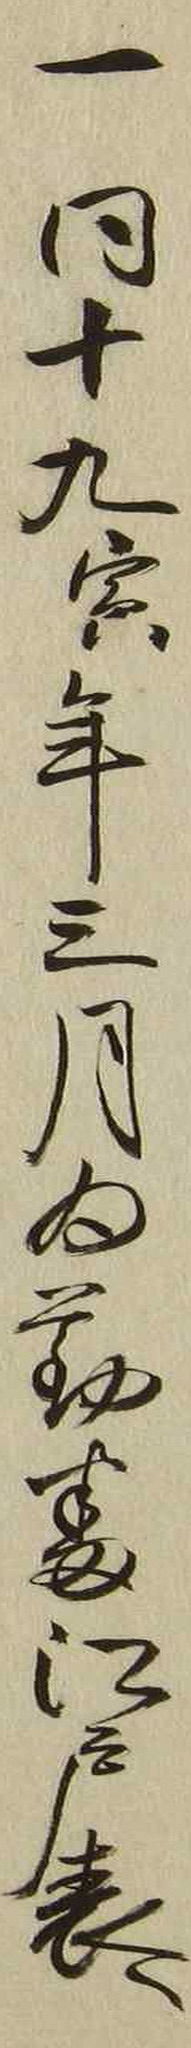一同十九寅年三月為勤番江戸表へ
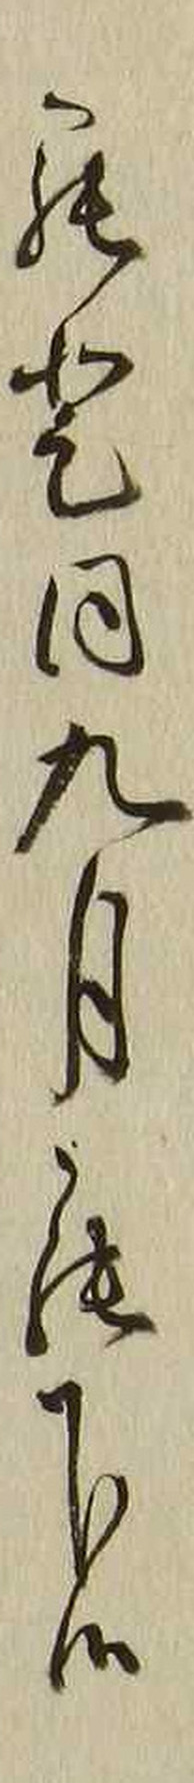罷登同九月罷下候
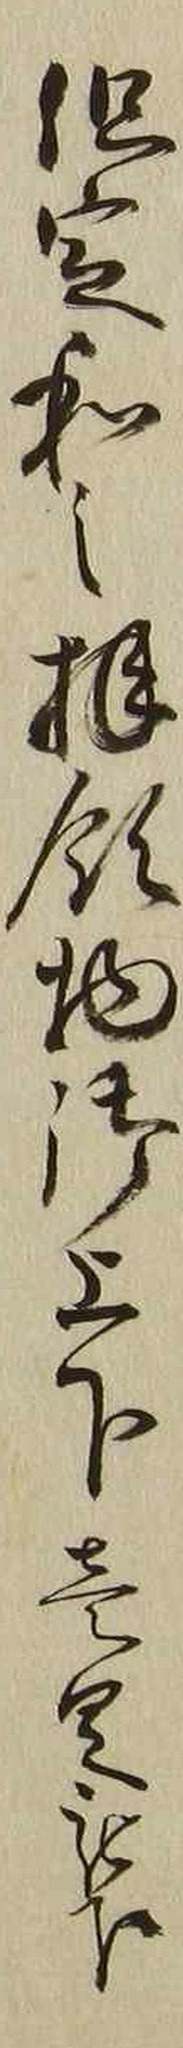但定和之拝領物御上下壱具被下
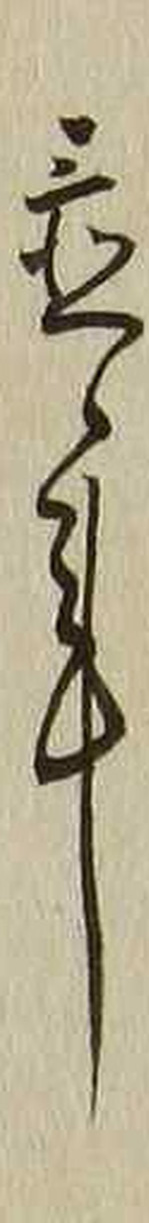置候事
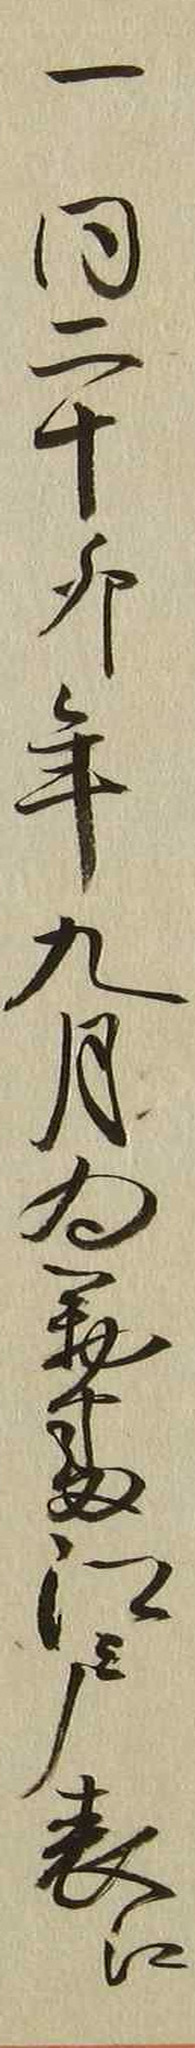一同二十卯年九月為勤番江戸表江
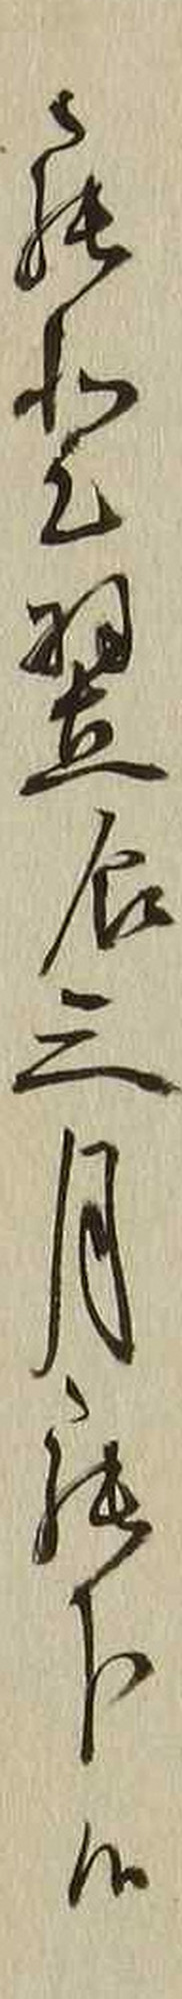罷登翌辰三月罷下候
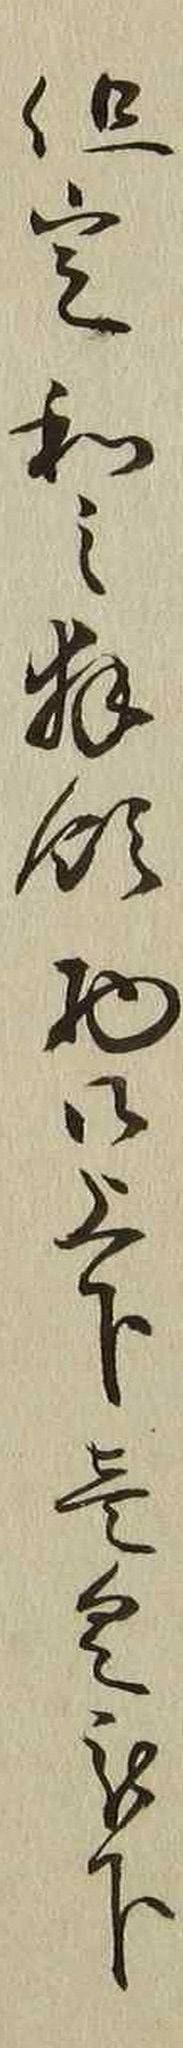但定和之拝領物御上下壱具被下
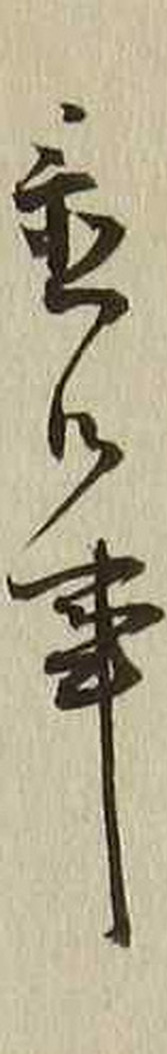置候事
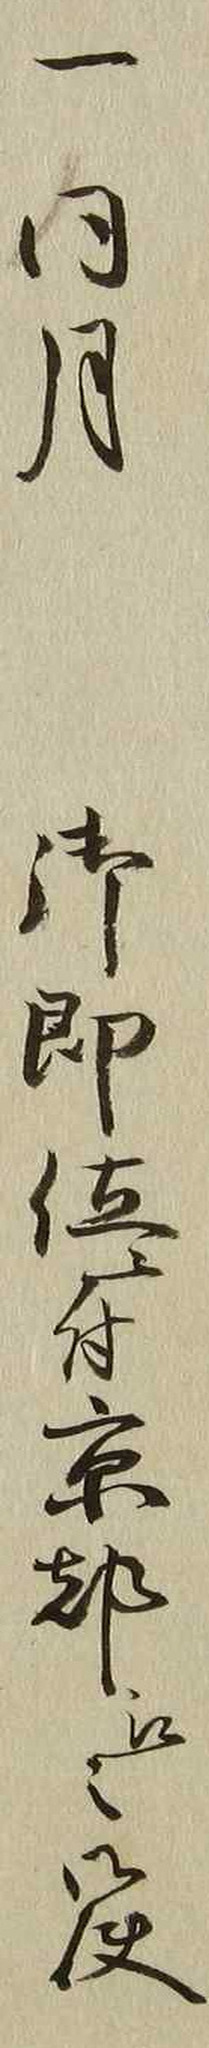一同月御即位ニ付京都江之御使
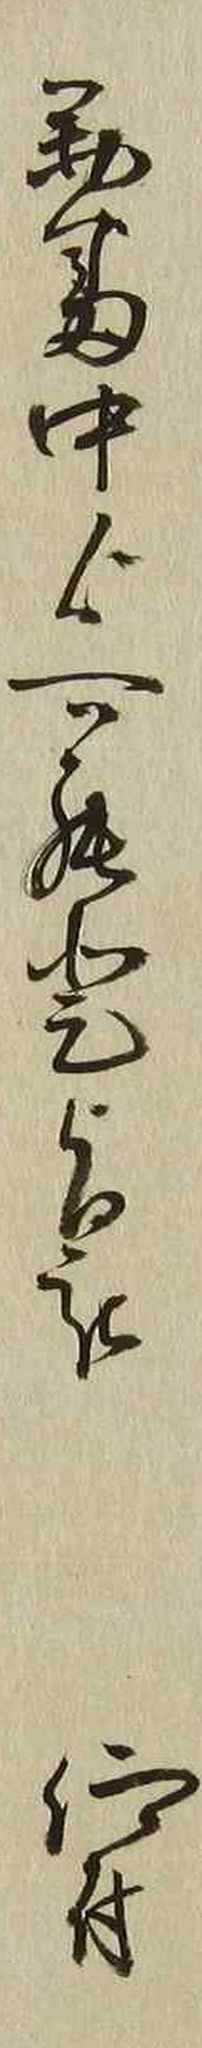勤番中ゟ可罷登被仰付
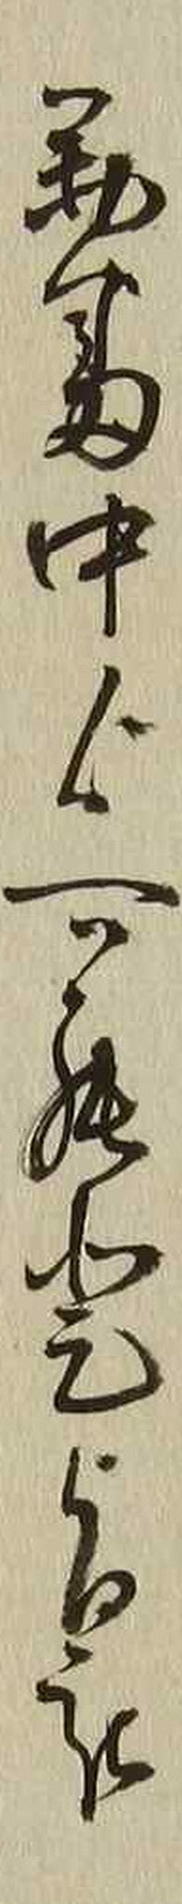勤番中ゟ可罷登被仰付
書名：諸士系譜　巻之60　と之部3
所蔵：会津若松市立会津図書館
